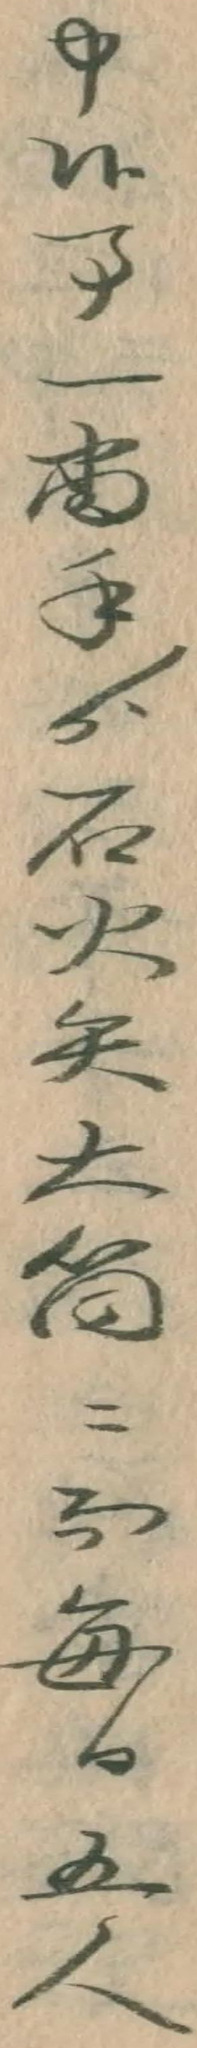申候事一番手ゟ石火矢大筒に而毎日五人
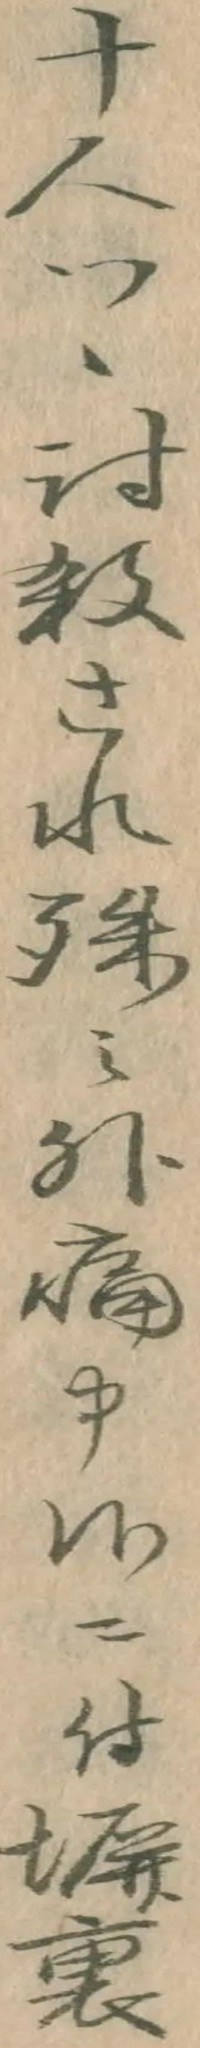十人つゝ討殺され殊之外痛申候に付塀裏
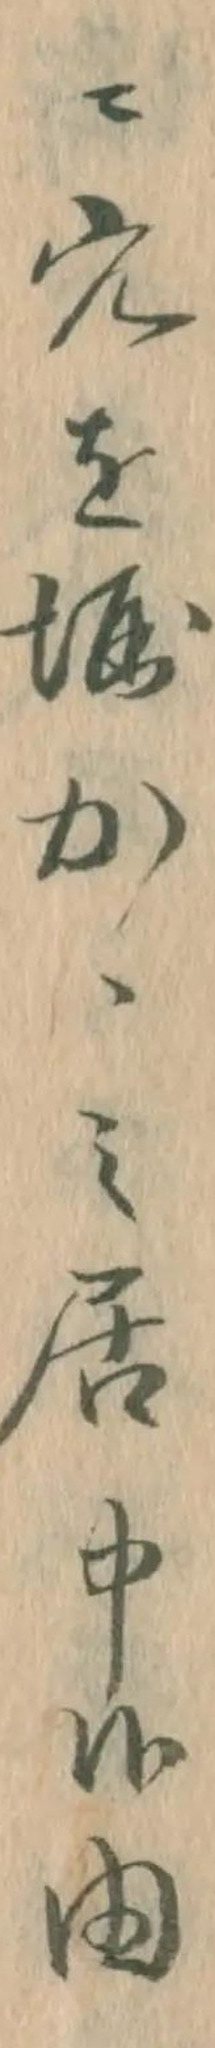に穴を堀かゝみ居申候由

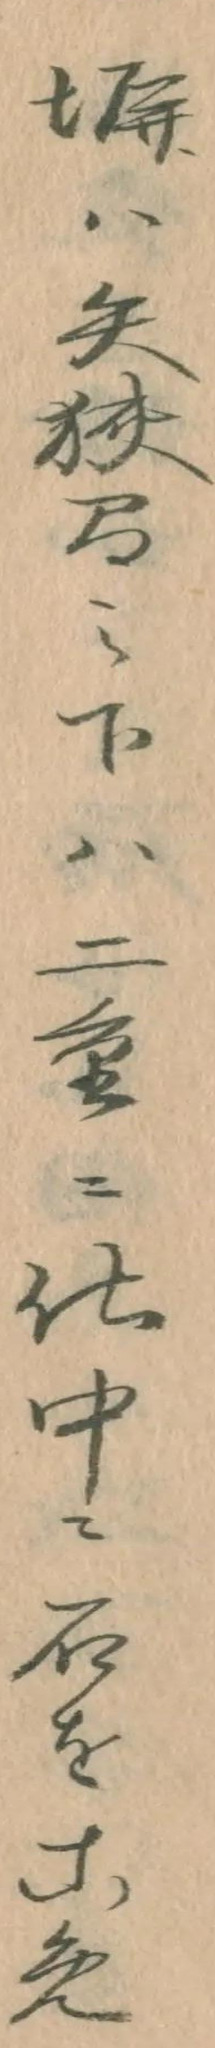一塀は矢狭間之下は二重に仕中に石を古免
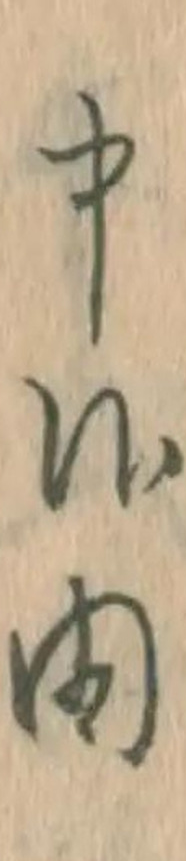申候由
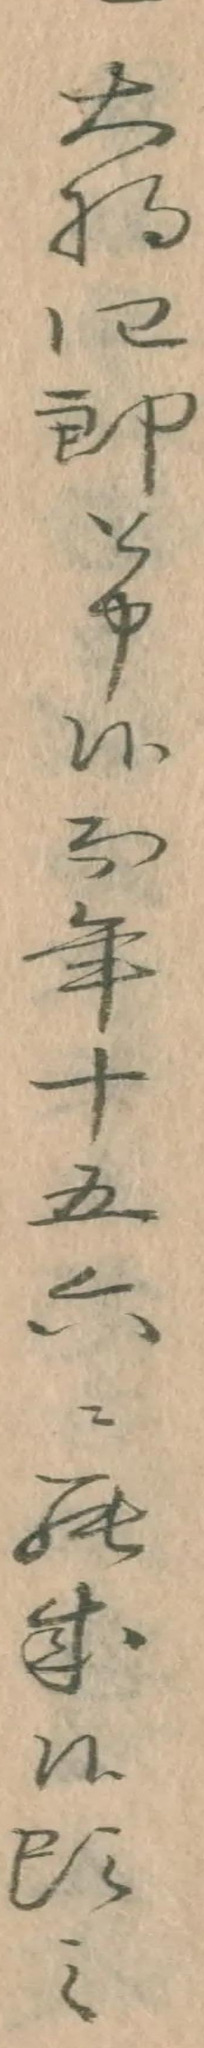一大将四郎と申候而年十五六に罷成候頭之
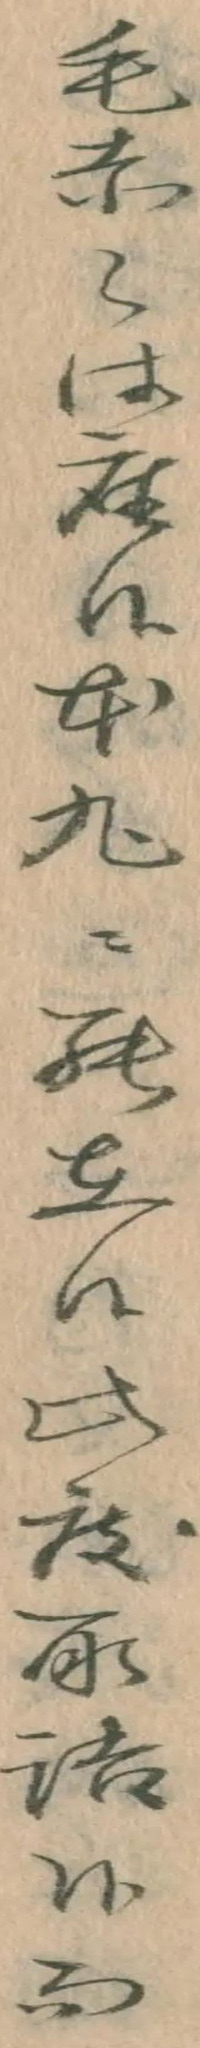毛赤く御座候本丸に罷在候此度取詰候而
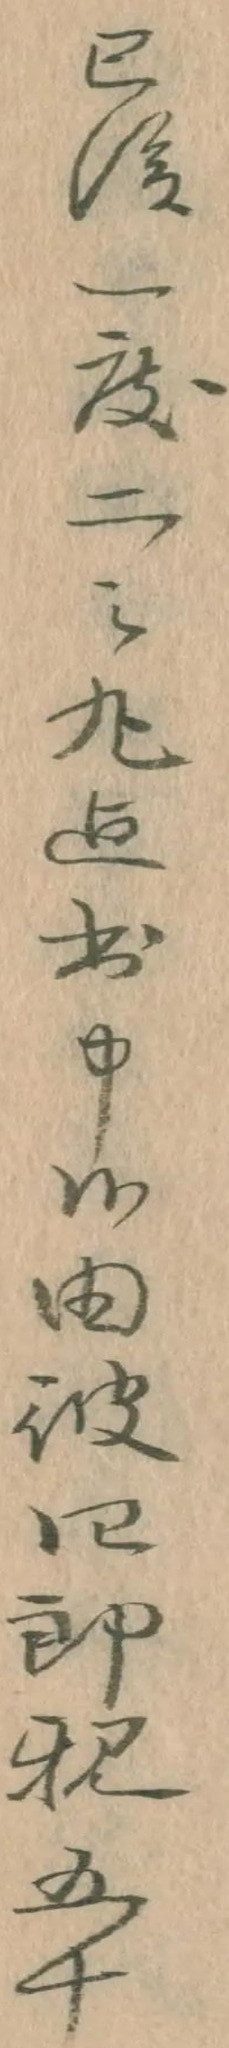已後一度二之丸迄出申候由彼四郎親五十
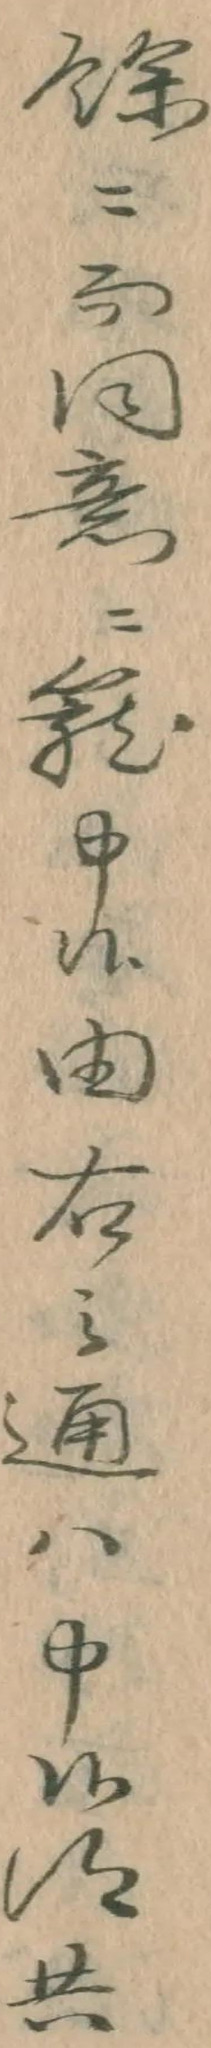余に而同意に籠申候由右之通は申候得共
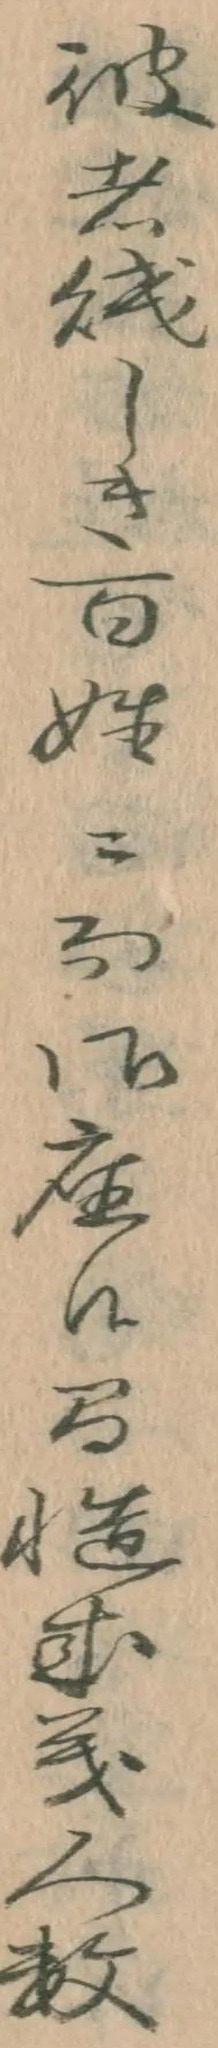彼者賤しき百姓に而御座候間慥成義人数
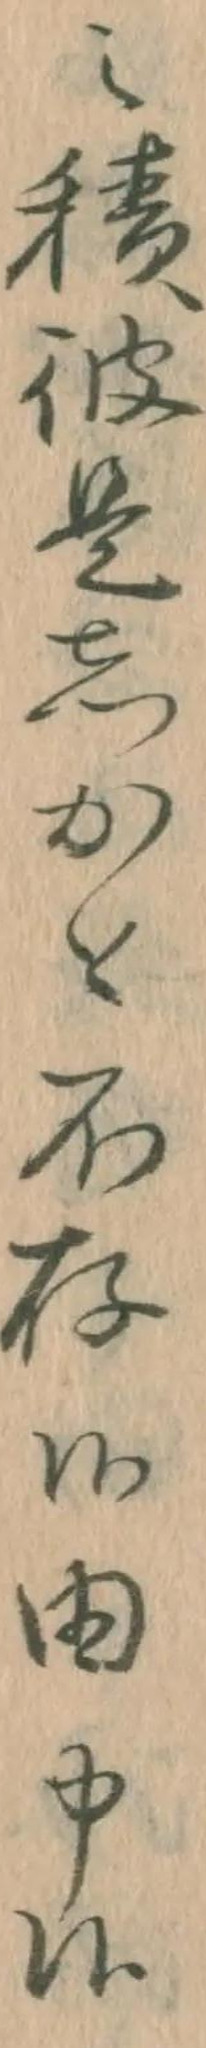之積彼是志かと不存候由申候
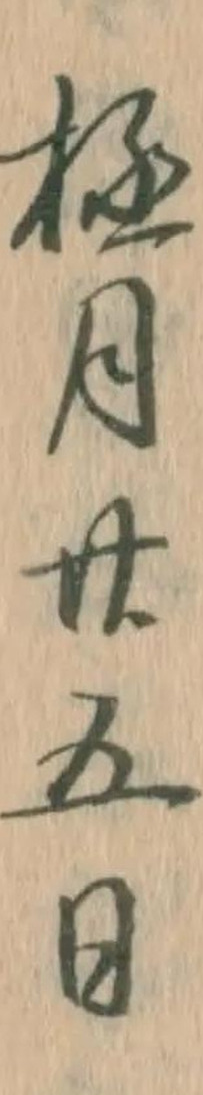極月廿五日
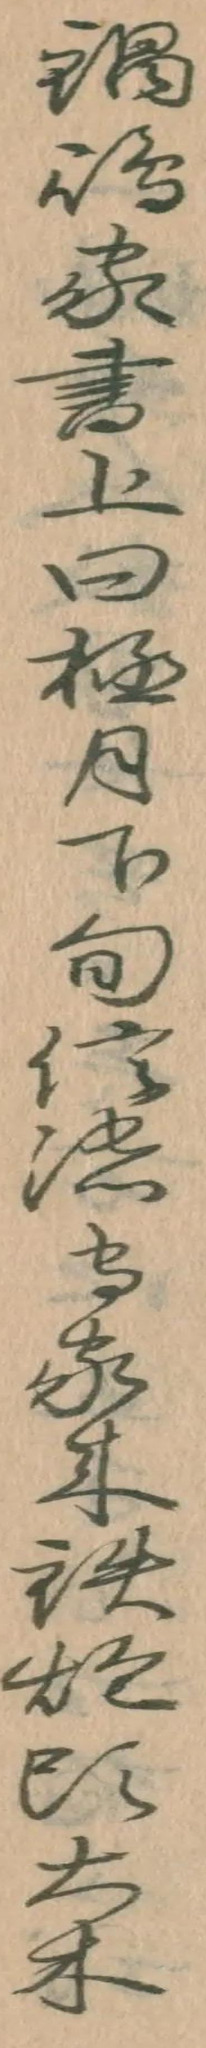鍋島家書上曰極月下旬信濃守家来鉄炮頭大木
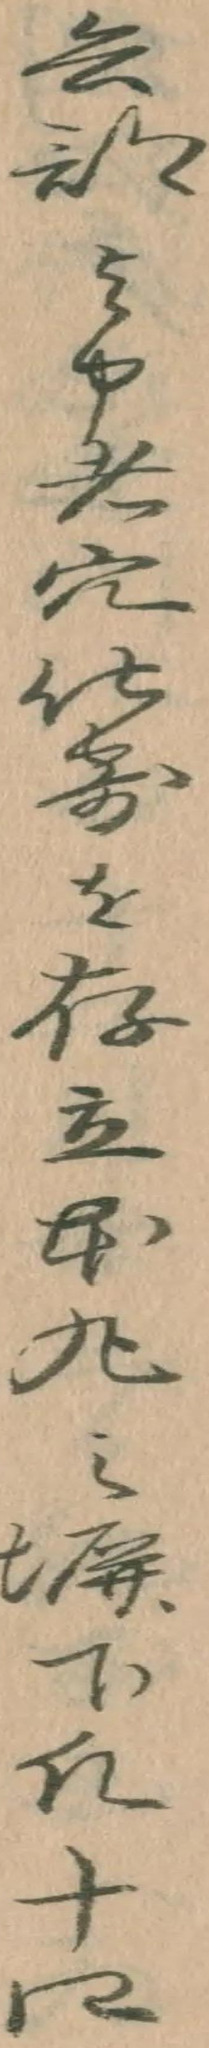兵部与申者穴仕寄を存立本丸之塀下凡十四
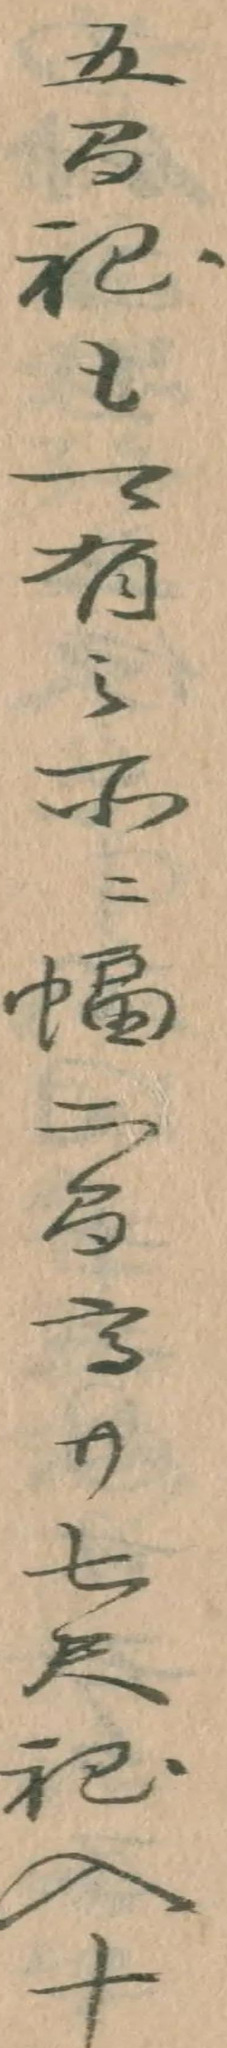五間程も可有之所に幅二間高さ七尺程入十
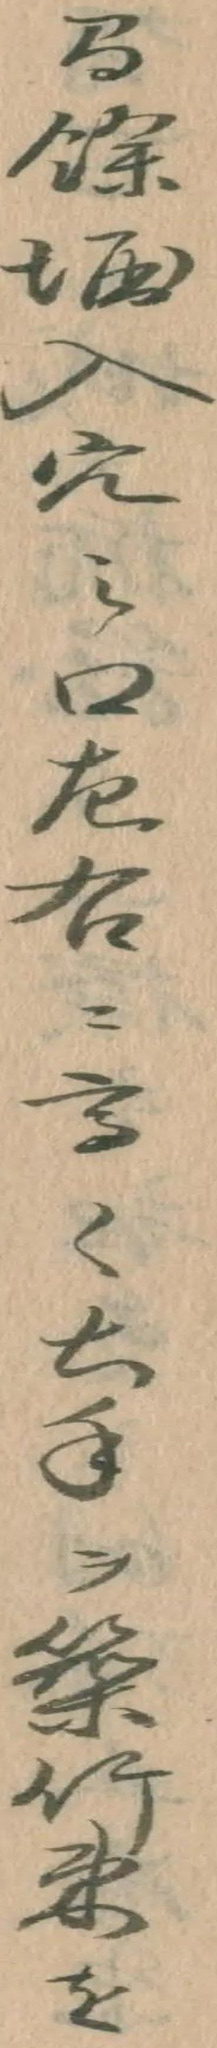間余堀入穴之口左右に高く土手を築竹束を
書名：切支丹御退治記 49巻. [4]
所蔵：国立国会図書館 National Diet Library, JAPAN
